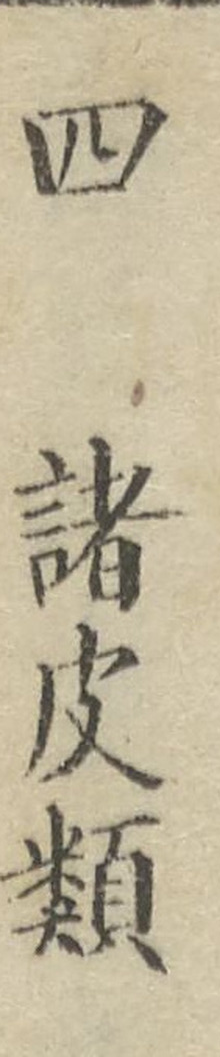四諸皮類
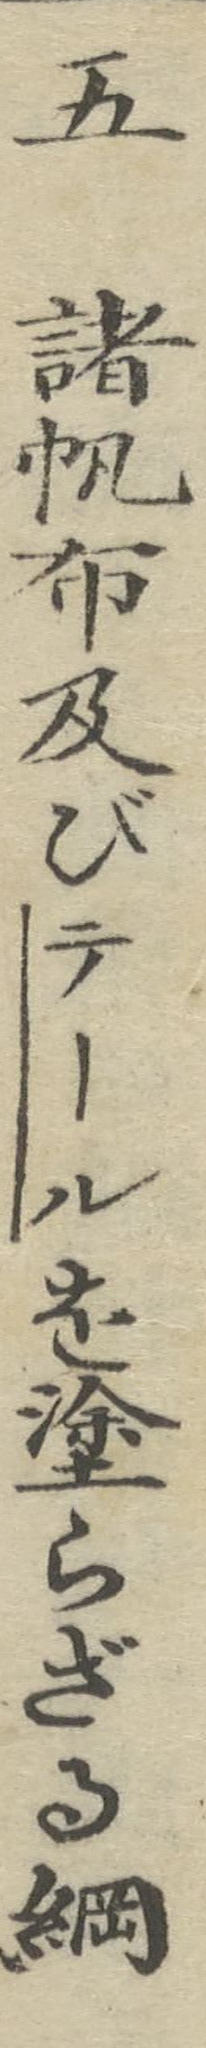五諸帆布及びテールを塗らざる網
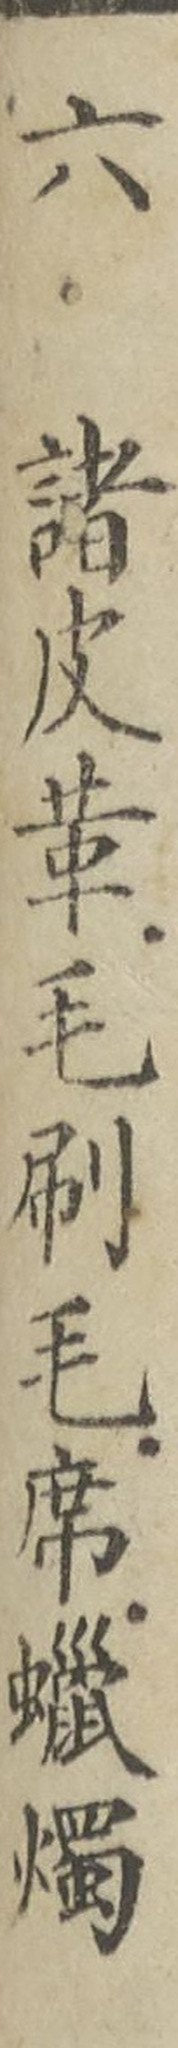六諸皮革、毛刷毛、席、蝋燭
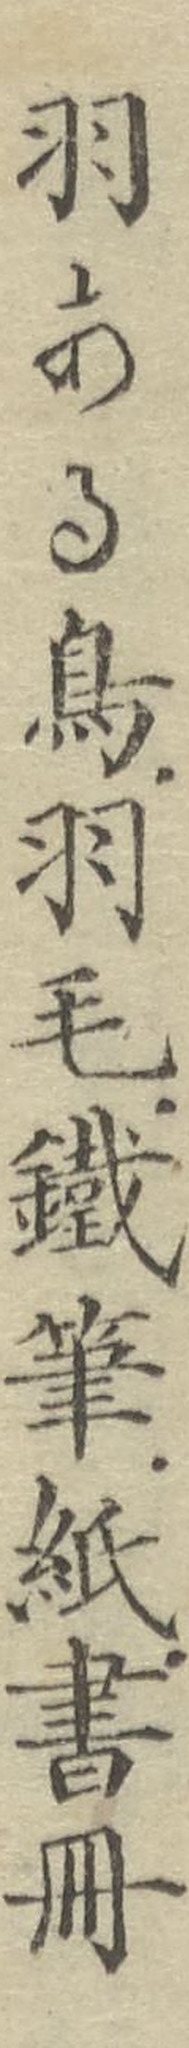羽ある鳥、羽毛、鐵筆、紙、書冊
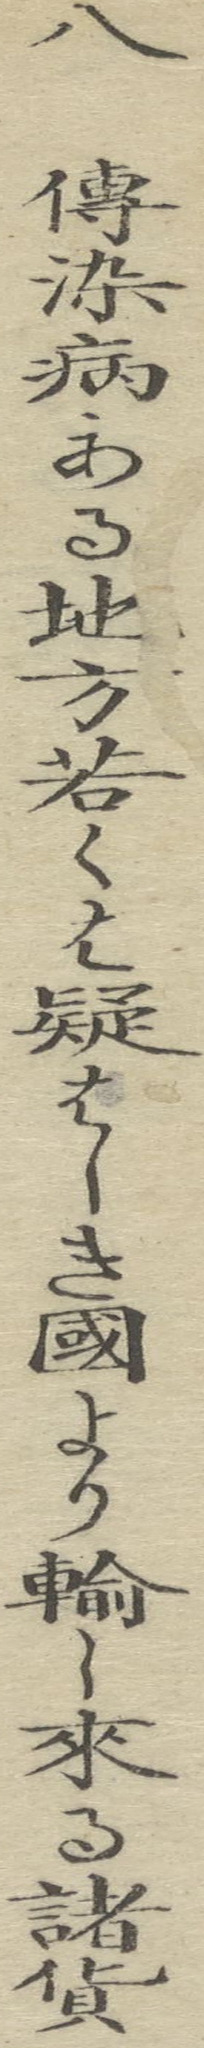八傅染病ある地方若くは疑はしき國より輸し來る諸貨
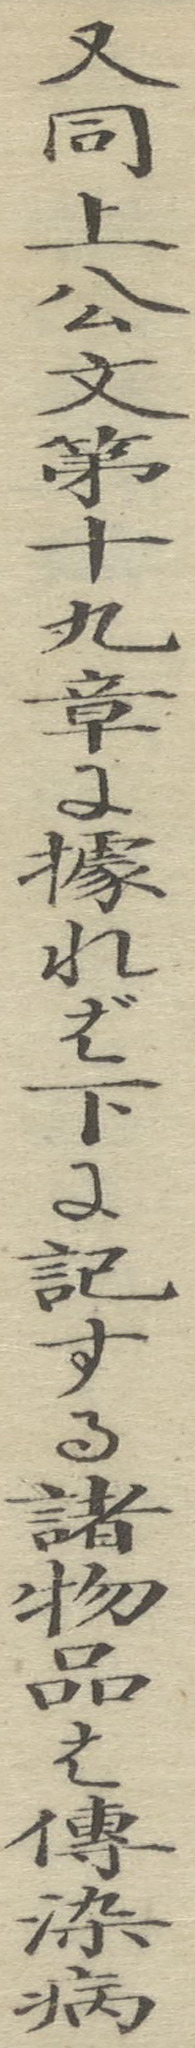又同上公文第十九章に據れば下に記する諸物品は傅染病
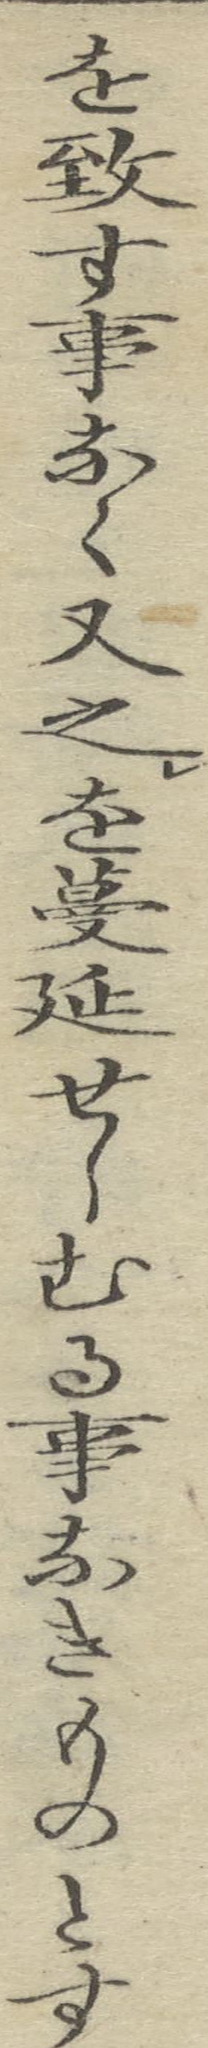を致す事なく又之萬延せしむる事なきものとす
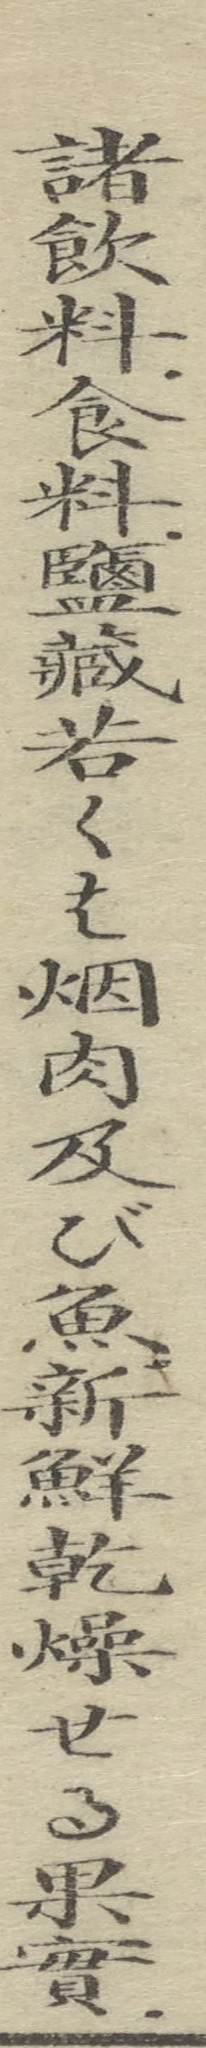一諸飲料、食料、䀋藏若くは烟肉及び魚、新鮮乾燥せる果實、
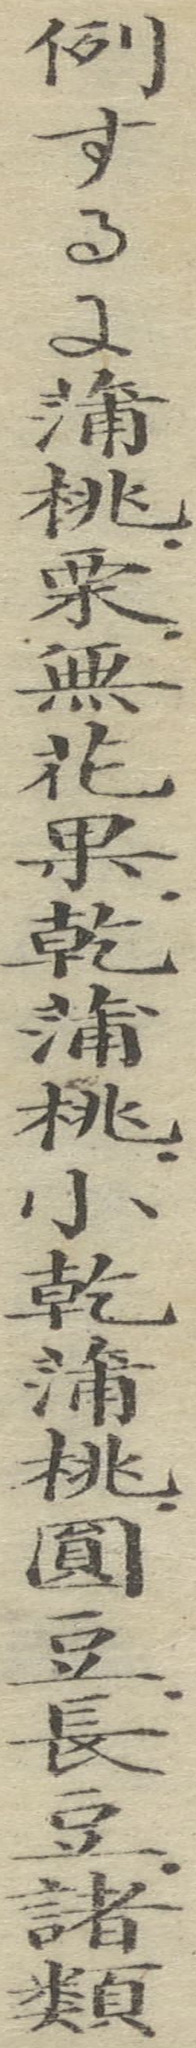例するに蒲桃、栗、粟、無花果、乾蒲桃、小乾蒲桃、圓豆、長豆、諸類
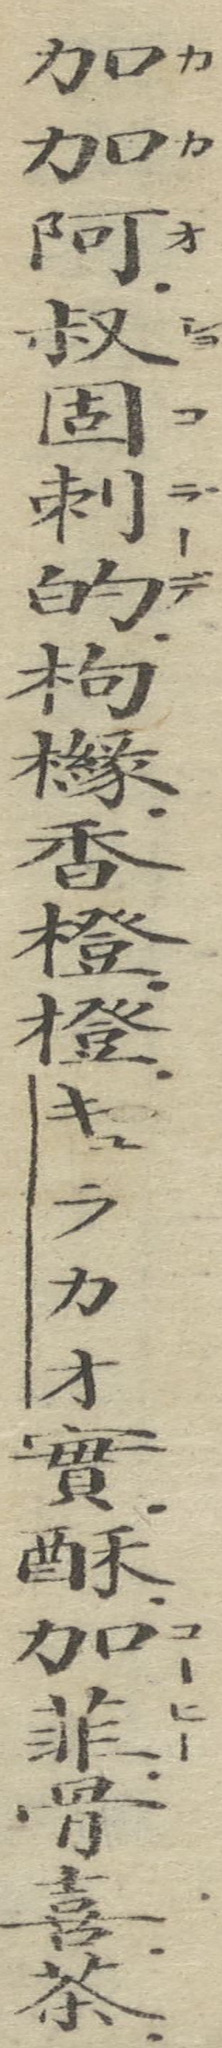加加阿、叔固刺的、枸櫞、香橙、橙、キュラカオ實、酥、加菲、骨喜、茶、

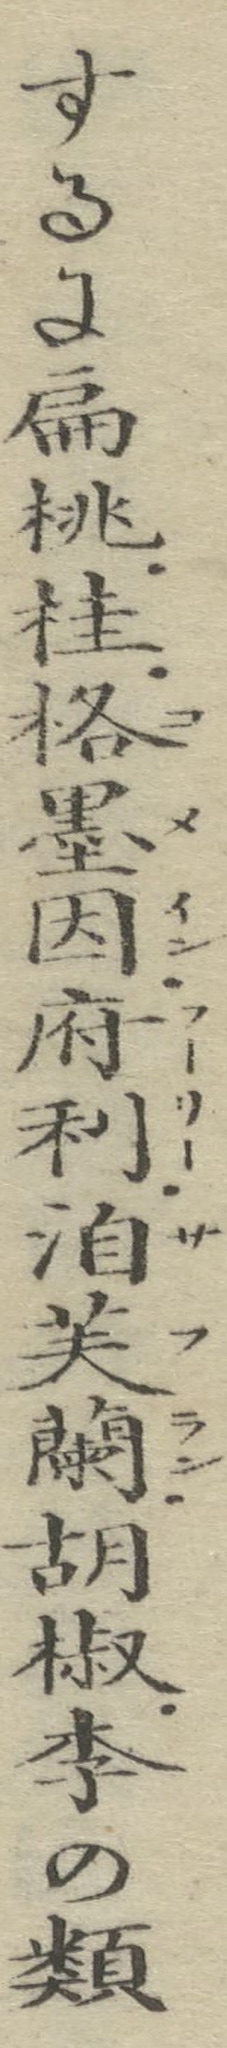するに扁桃、桂、格墨因、府利、洎芙蘭、胡椒、李の類
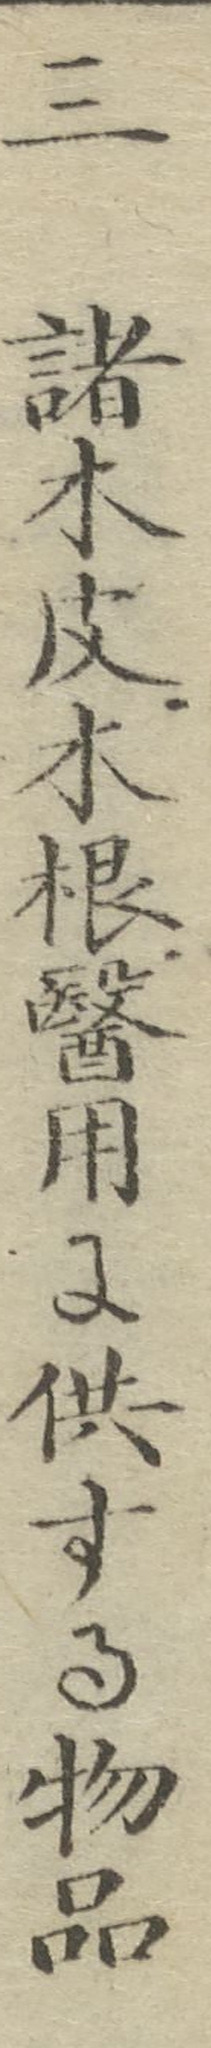三諸木皮、木根、醫用に供する物品
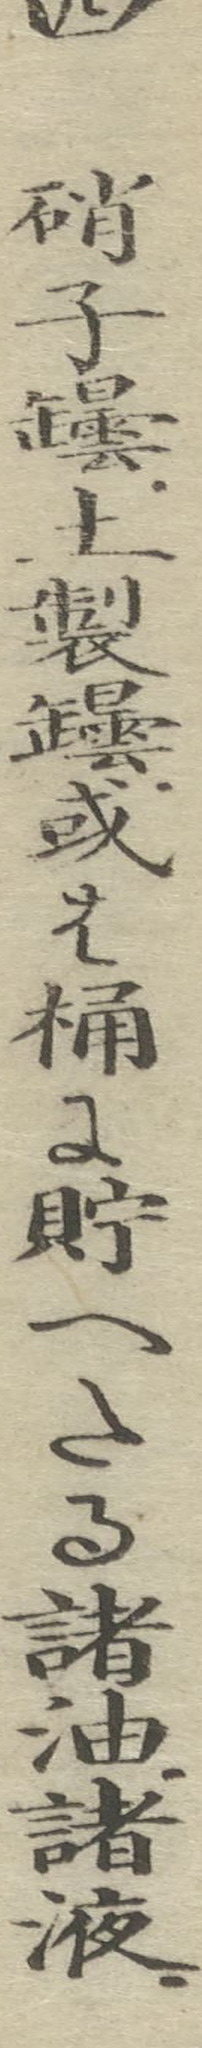四硝子壜、土製壜或は桶に貯へたる諸油、諸液、
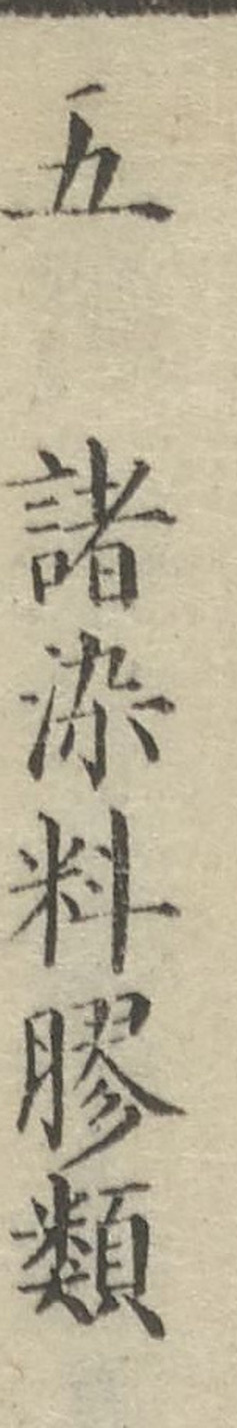五諸染料膠類
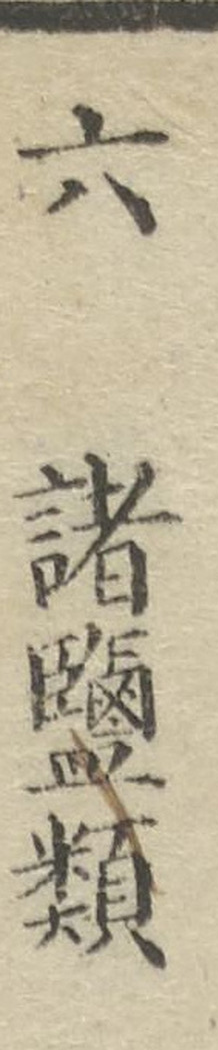六諸䀋類
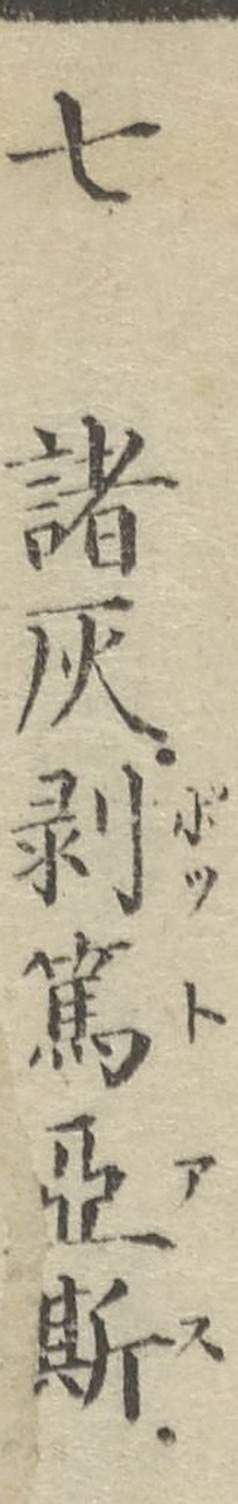七諸灰、剥篤亞斯、
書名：官版疫毒預防説　全
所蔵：東京大学総合図書館 General Library in the University of Tokyo, JAPAN
